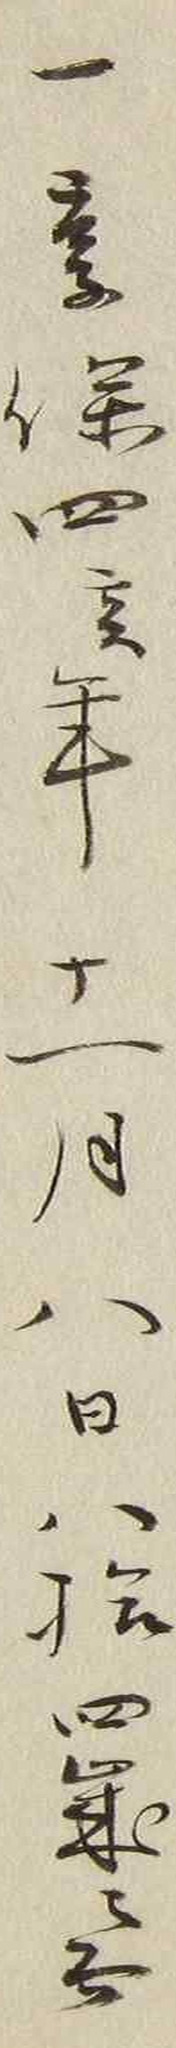一享保四亥年十一月八日八拾四歳に而
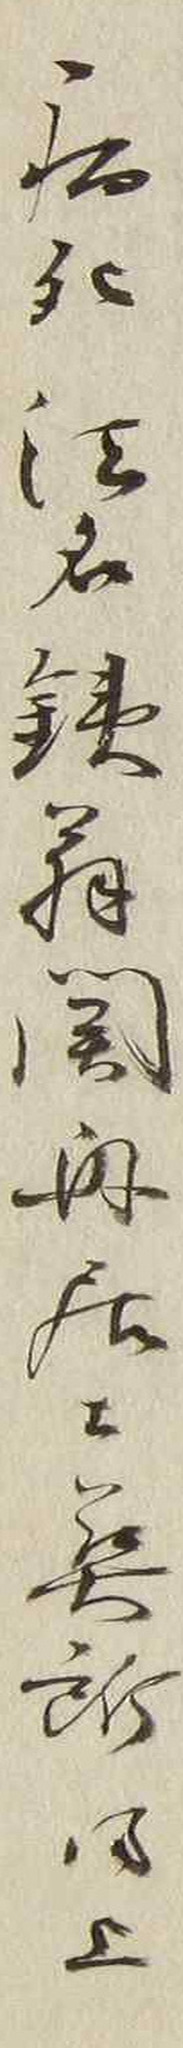病死法名鉄翁関舟居士葬所同上

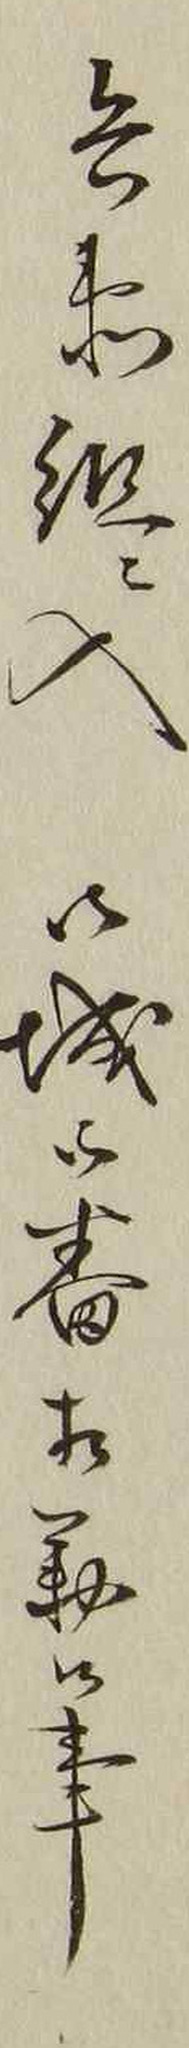兵衛組に入御城御番相勤候事
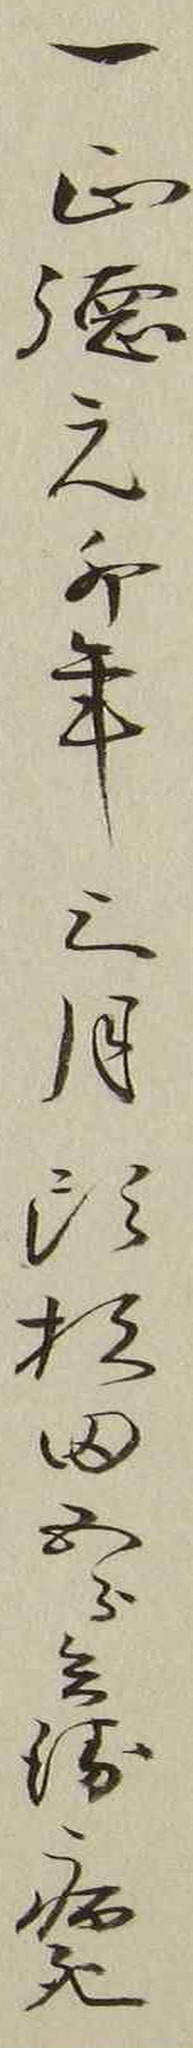一正徳元卯年三月頭杦田五郎兵衛病死
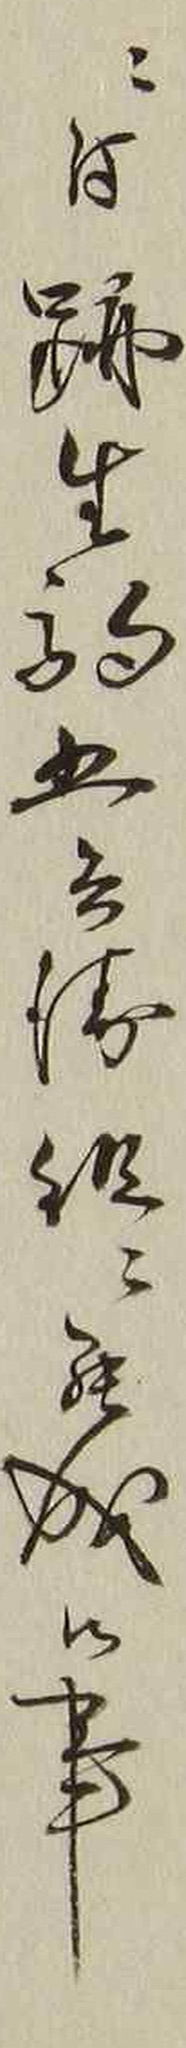に付跡生駒五兵衛組に罷成候事
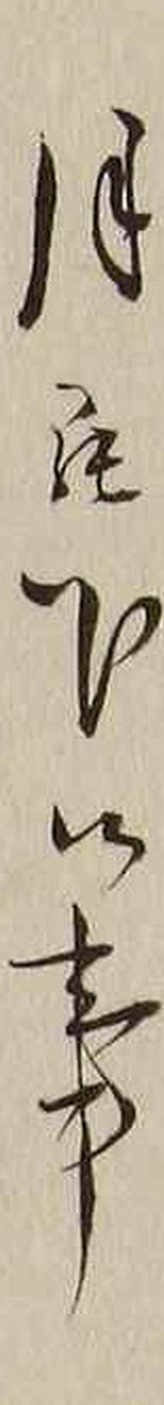月罷下候事
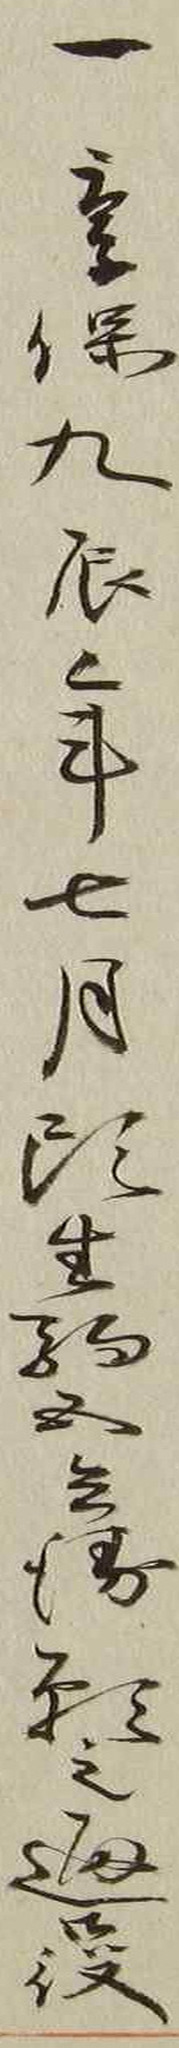一享保九辰年七月頭生駒五兵衛願之通御役
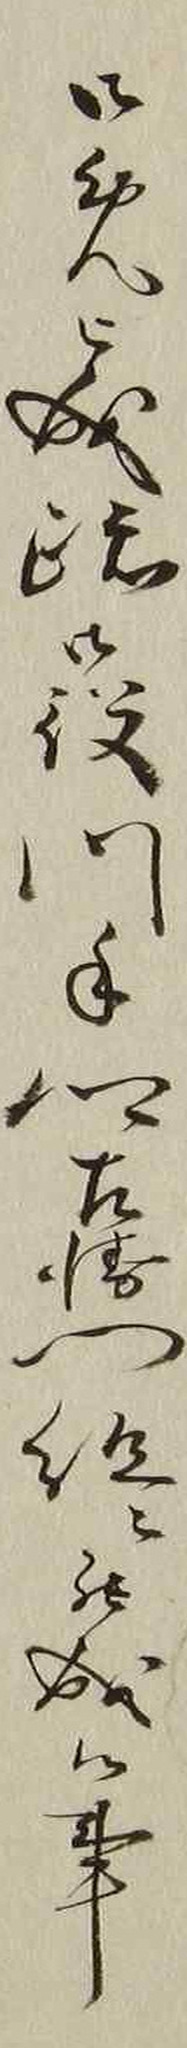御免被成跡御役川手郷左衛門組に罷成候事
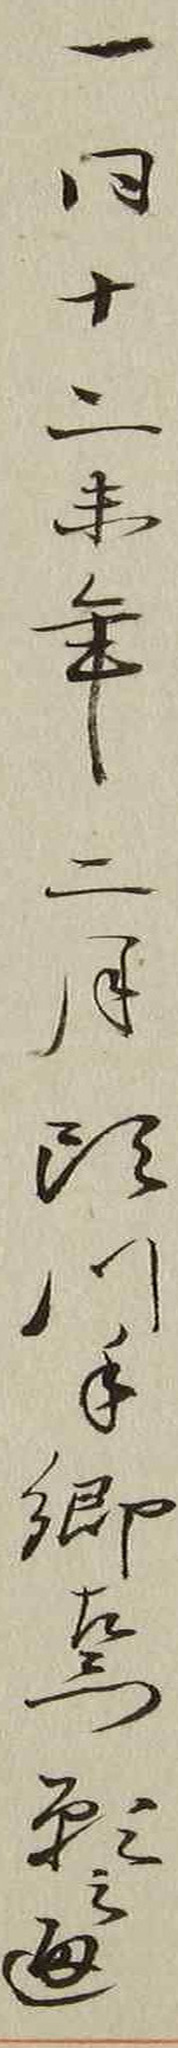一同十二未年二月頭川手郷左衛門願之通
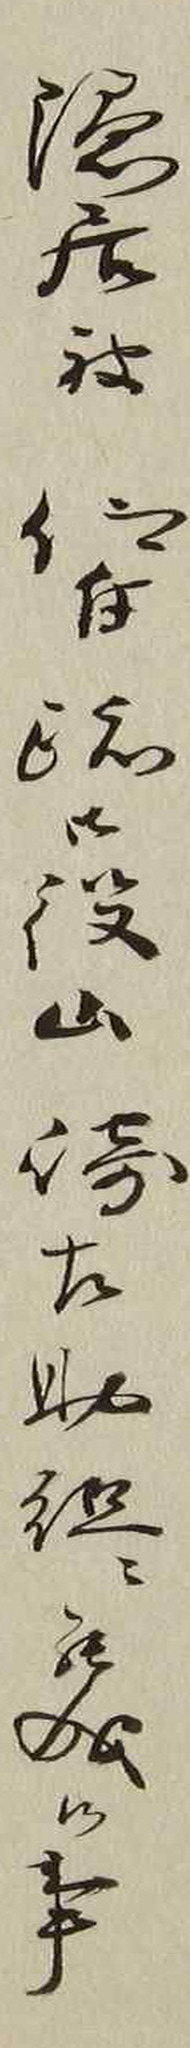隠居被仰付跡御役山崎左助組に罷成候事
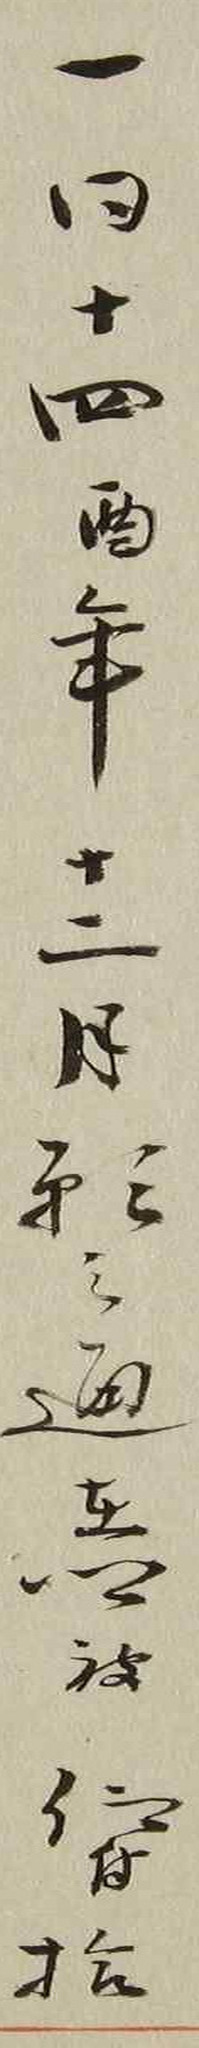一同十四酉年十二月願之通在郷被仰付拾
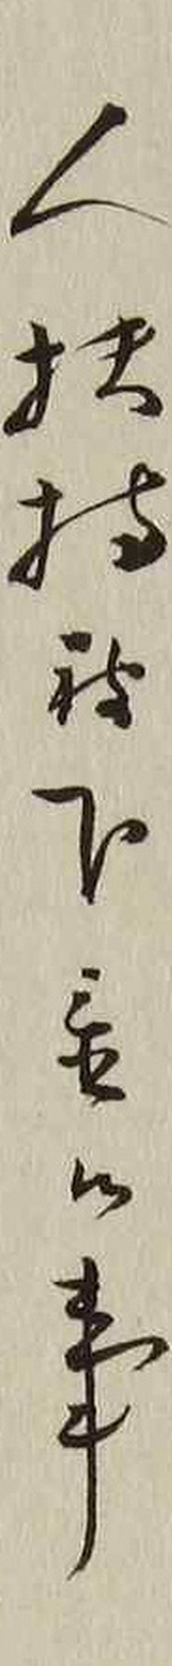人扶持被下置候事
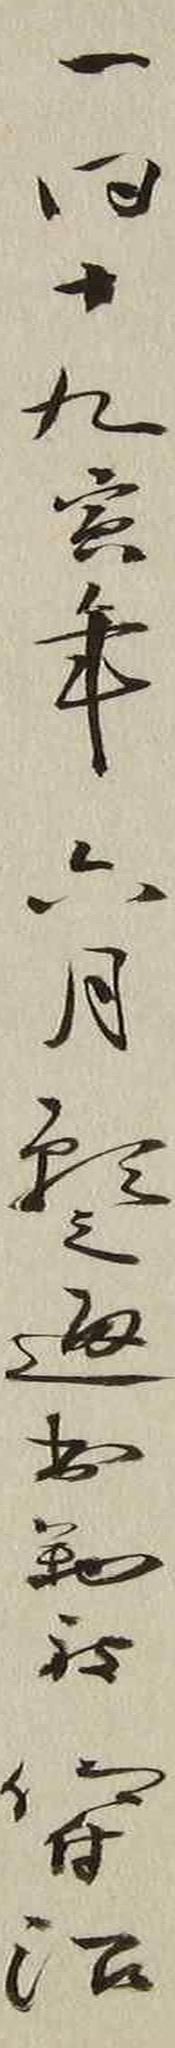一同十九寅年六月願之通出勤被仰付沼
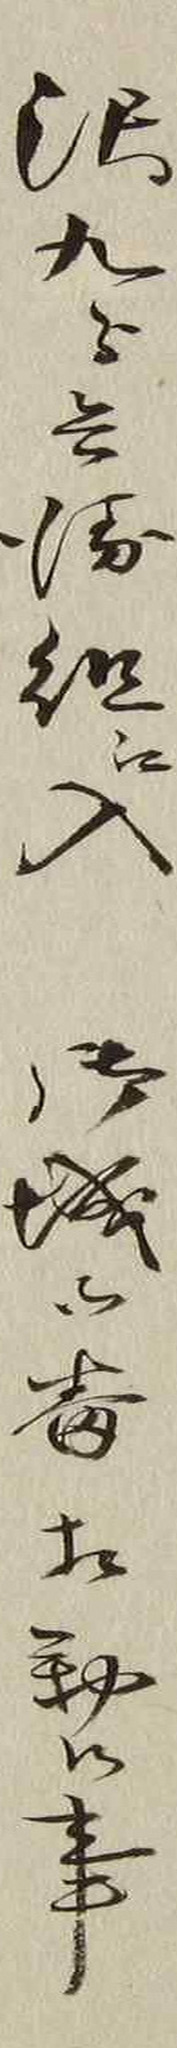沢九郎兵衛組え入御城御番相勤候事
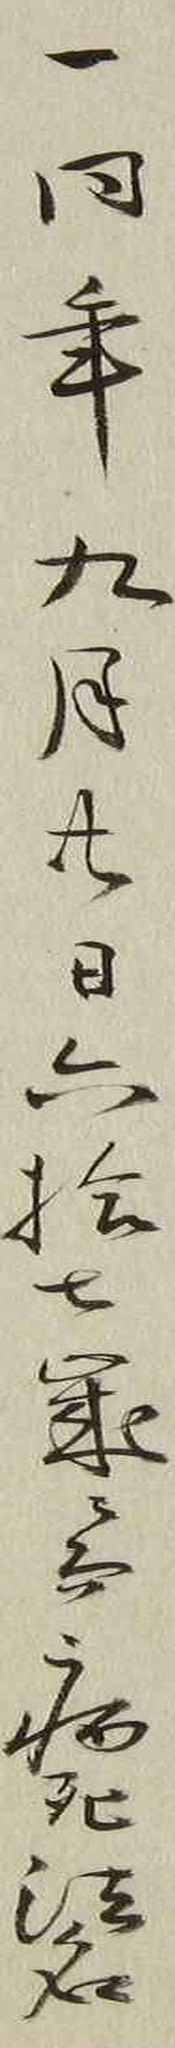一同年九月廿日六拾七歳に而病死法名
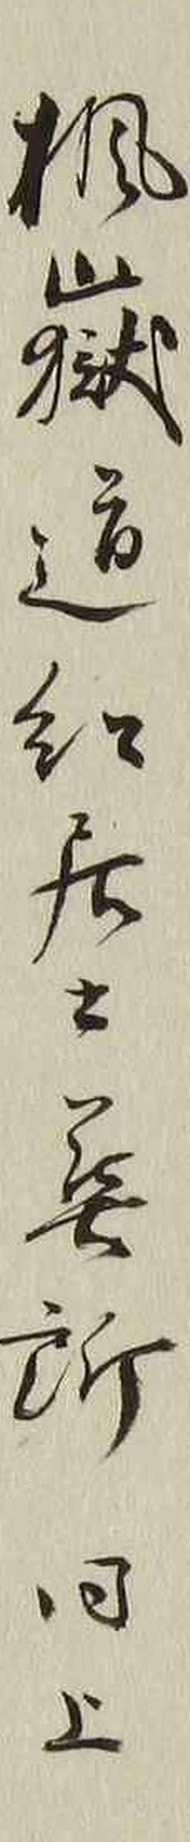楓岳道紅居士葬所同上
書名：諸士系譜　巻之157　ね之部1
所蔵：会津若松市立会津図書館
